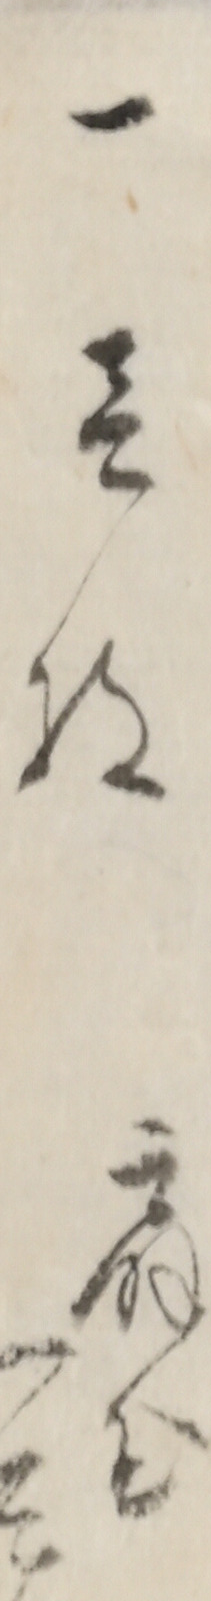一壱枚糸由

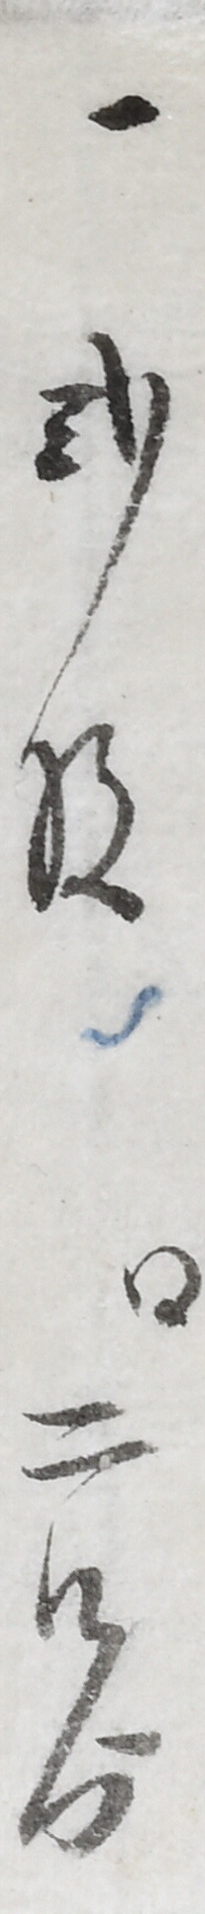一弐枚二右衛門
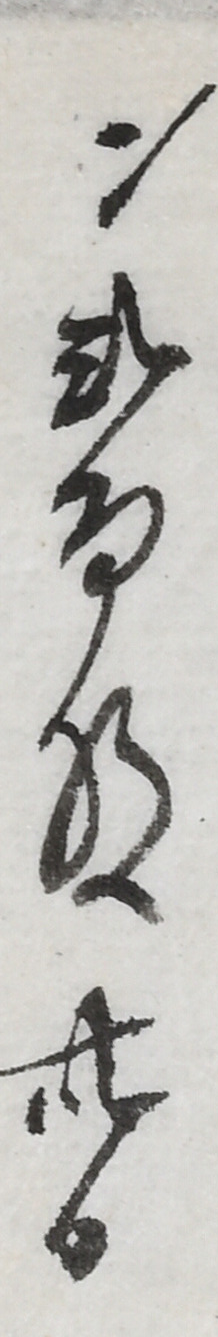〆弐百枚廿日
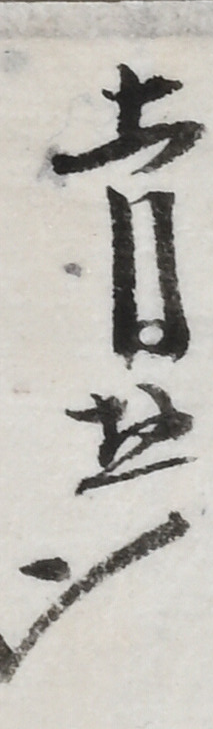十一月惣〆
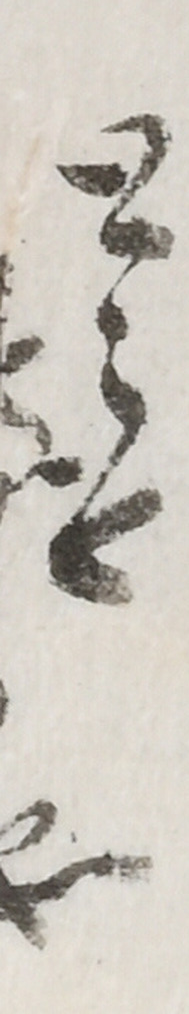とらや
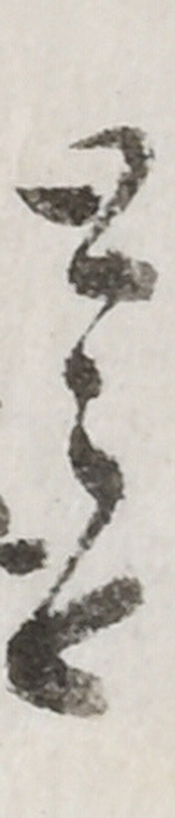とらや
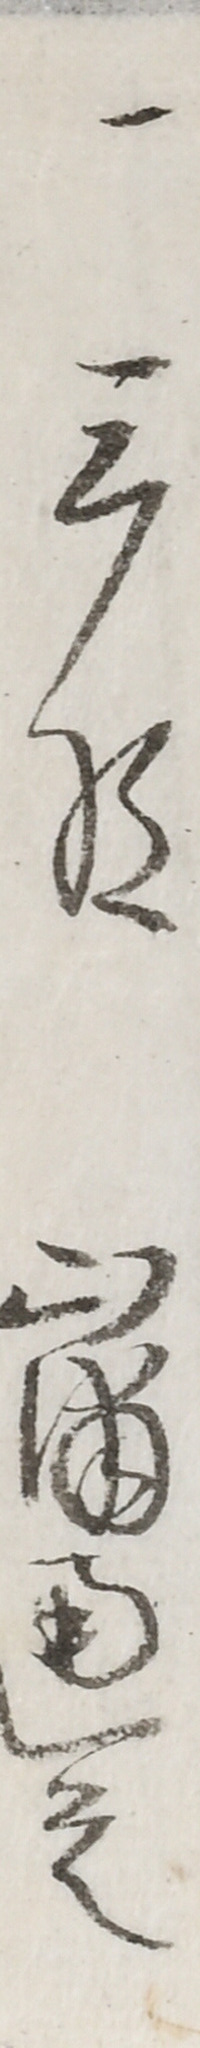一三枚山浦通覚
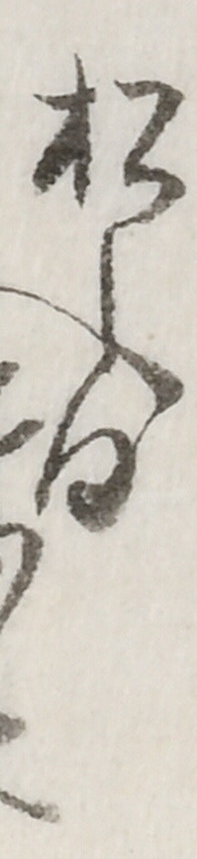松之湯
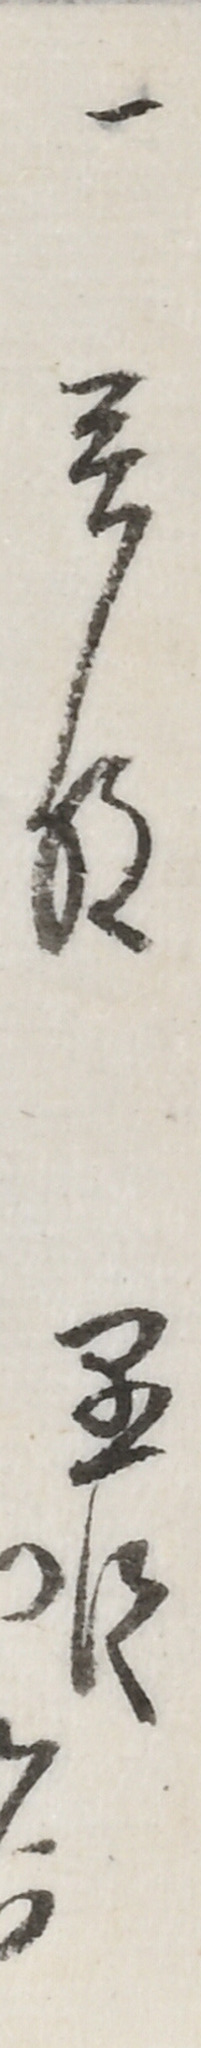一壱枚弥七
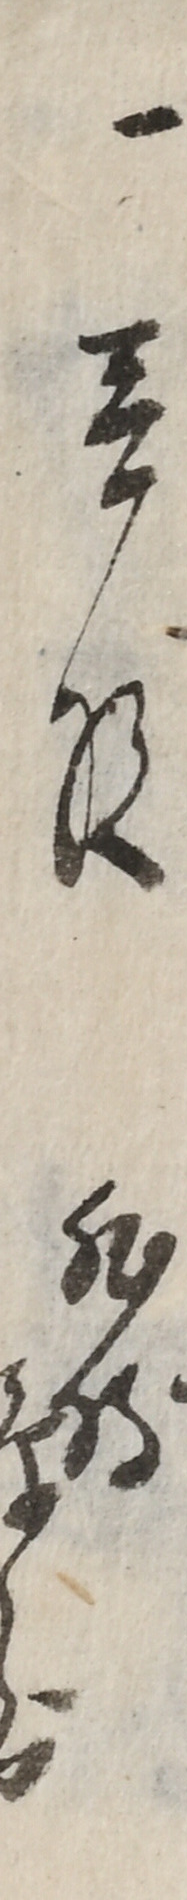一壱枚弥七
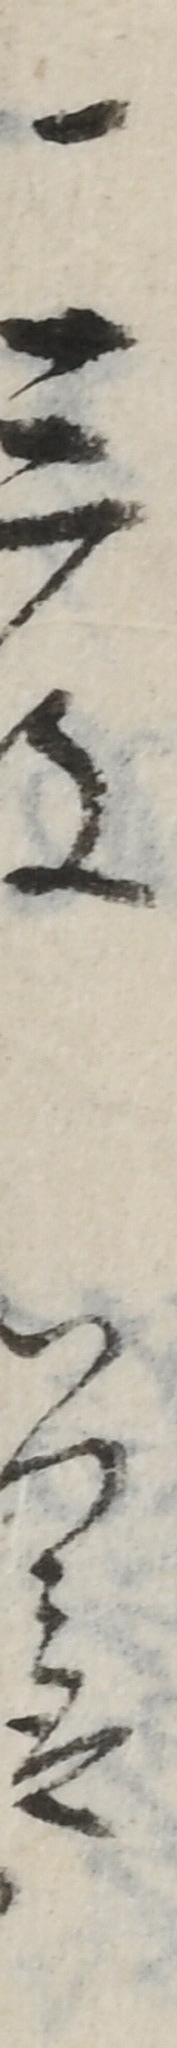一五枚同人

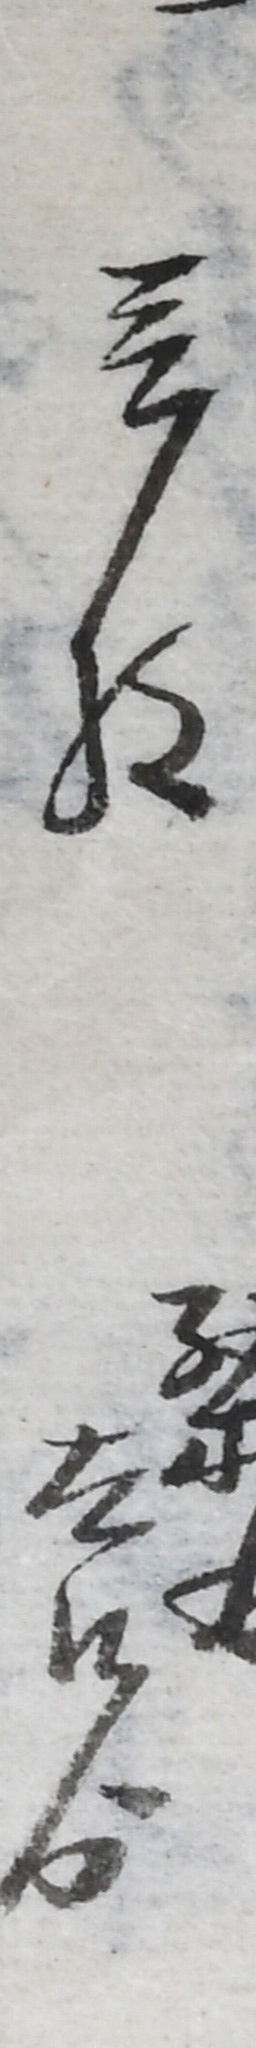一壱枚孫左衛門
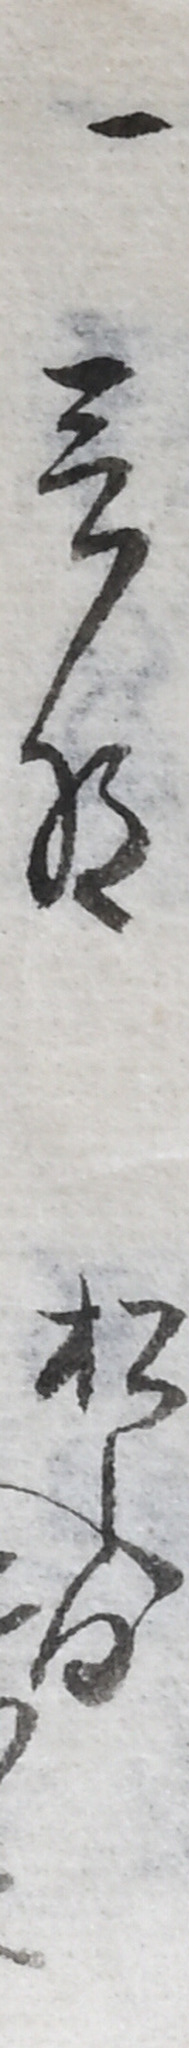一弐枚戸右衛門
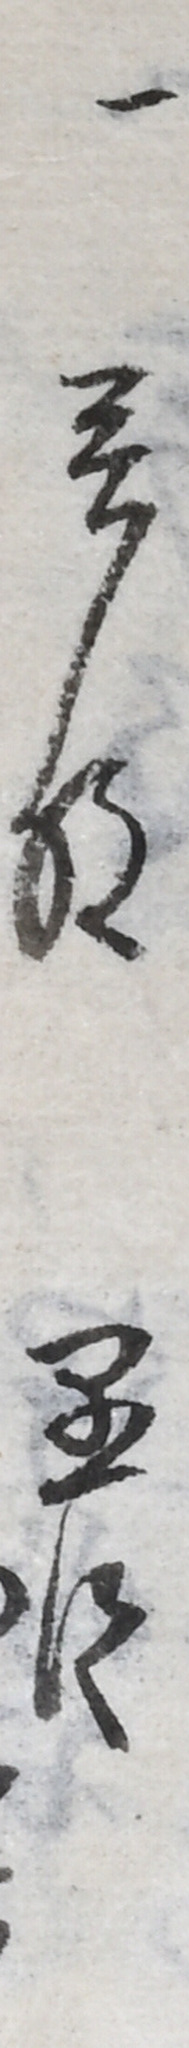一壱枚孫八
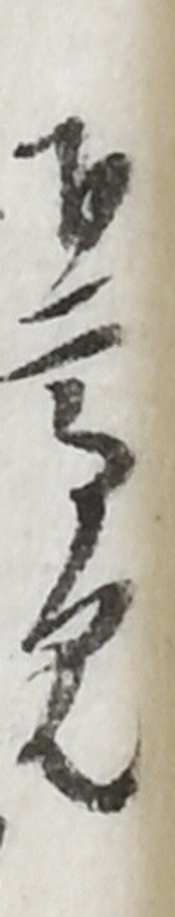下高見
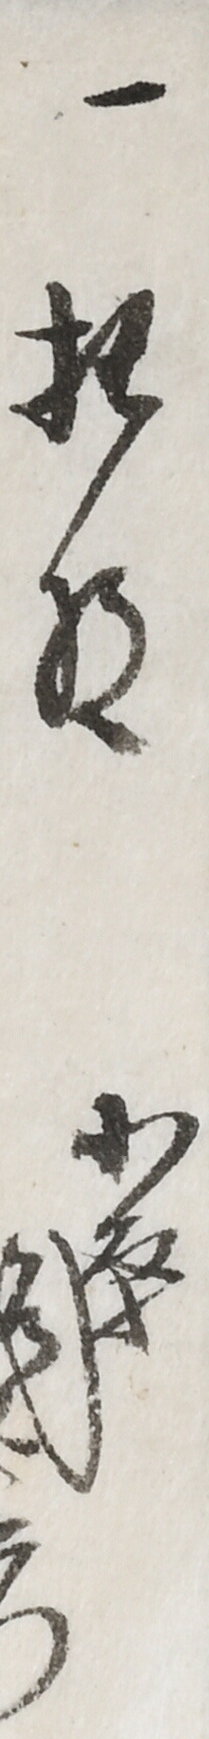一弐枚戸右衛門
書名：髙遠限楮幣引換覚帳
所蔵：伊那市立高遠町図書館・合同会社AMANE
